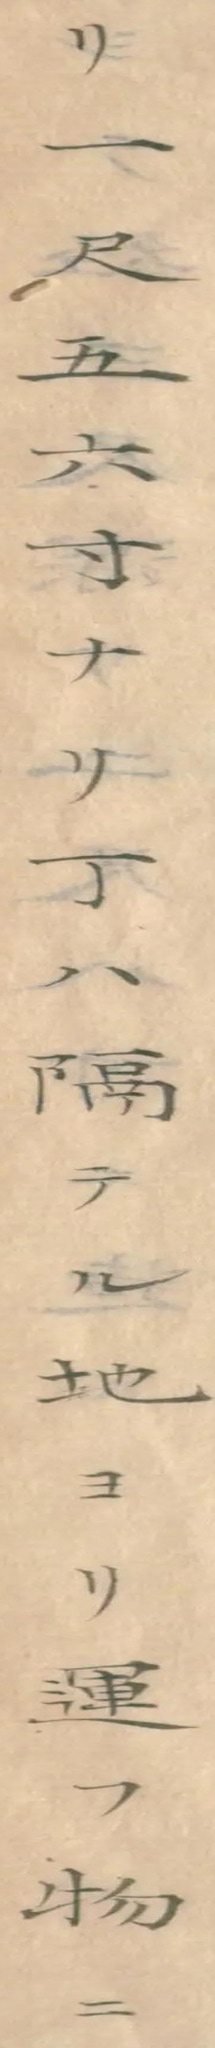リ一尺五六寸ナリ丁ハ隔テル地ヨリ運フ物ニ

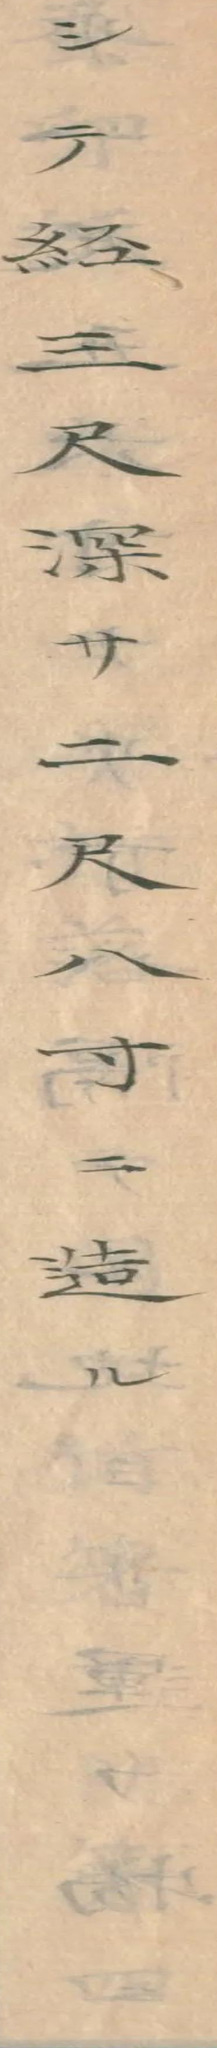シテ経三尺深サ二尺八寸ニ造ル
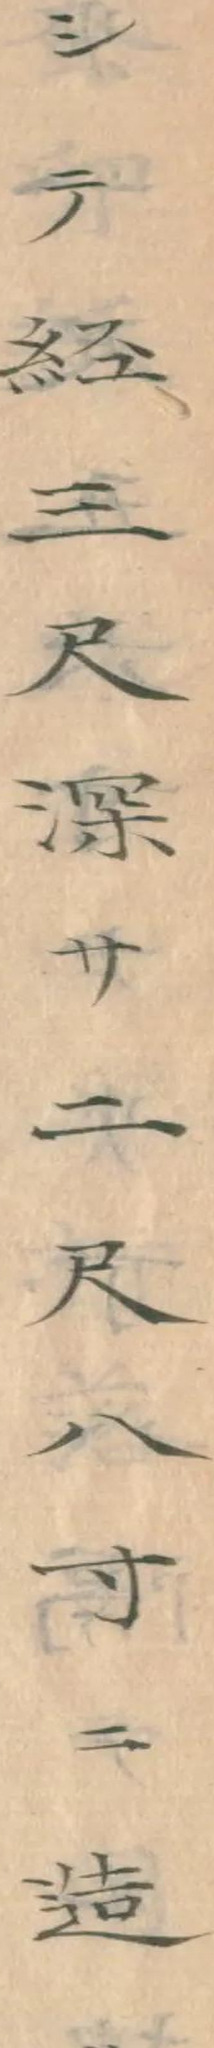シテ経三尺深サ二尺八寸ニ造ル
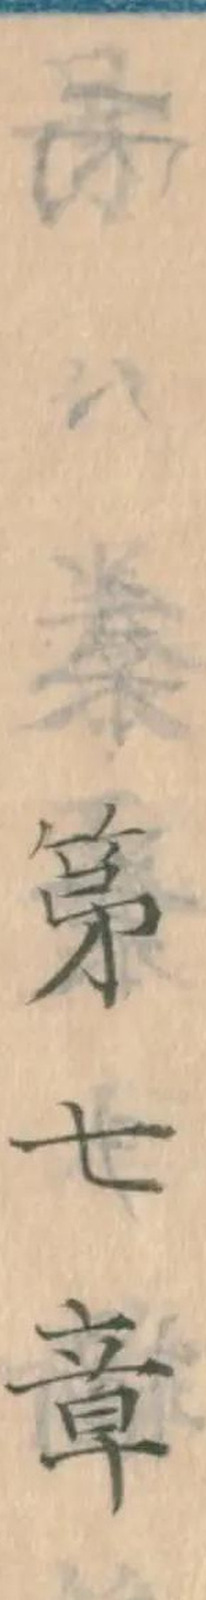第七章
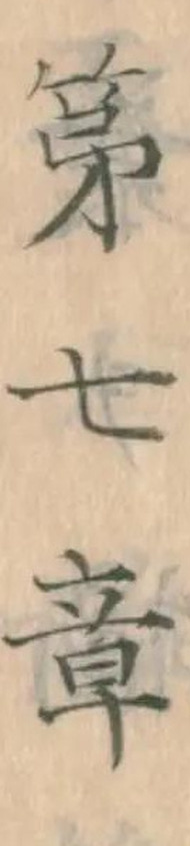第七章
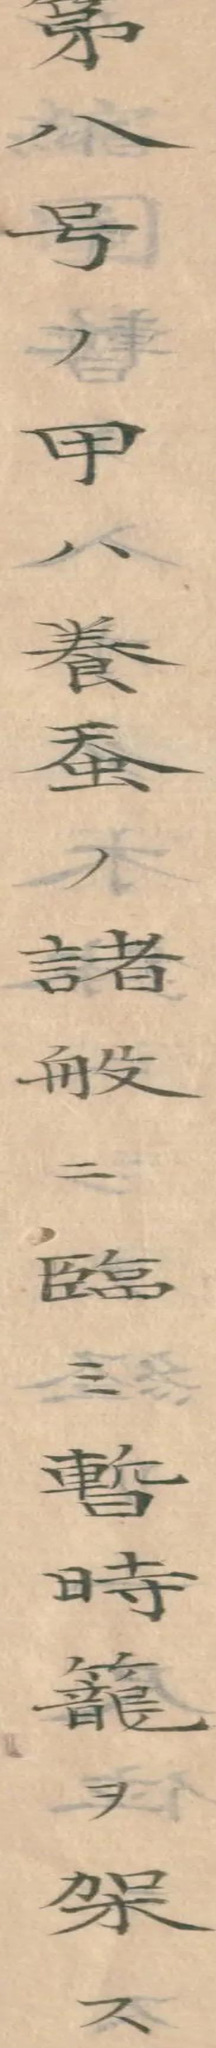第八号ノ甲ハ養蚕ノ諸般ニ臨ミ暫時籠ヲ架ス
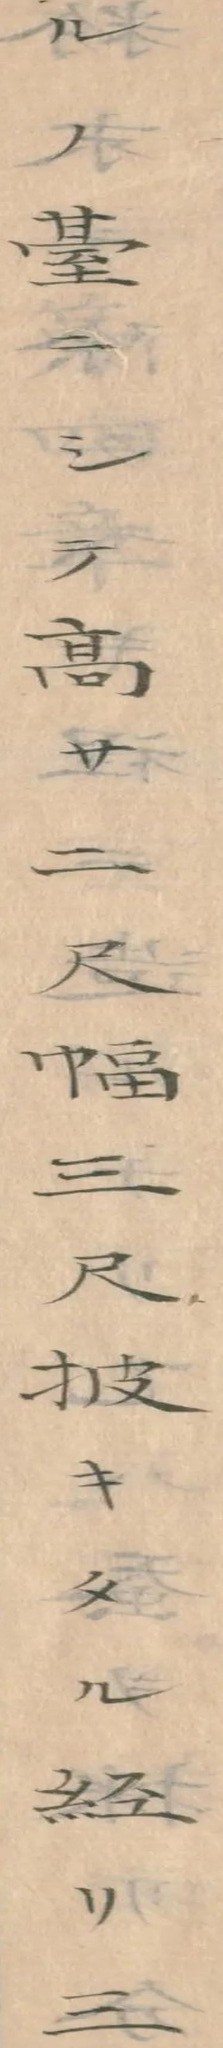ルノ台ニシテ高サ二尺幅三尺披キタル経リ三
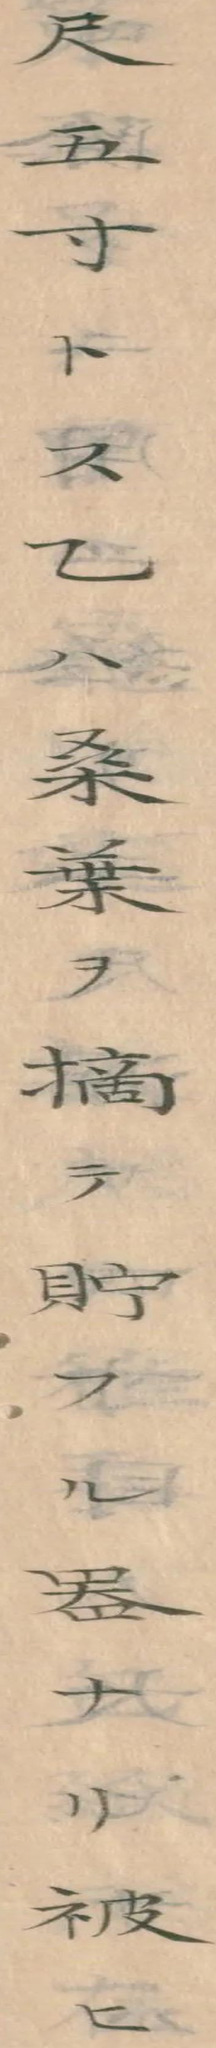尺五寸トス乙ハ桑葉ヲ摘テ貯フル器ナリ被ヒ
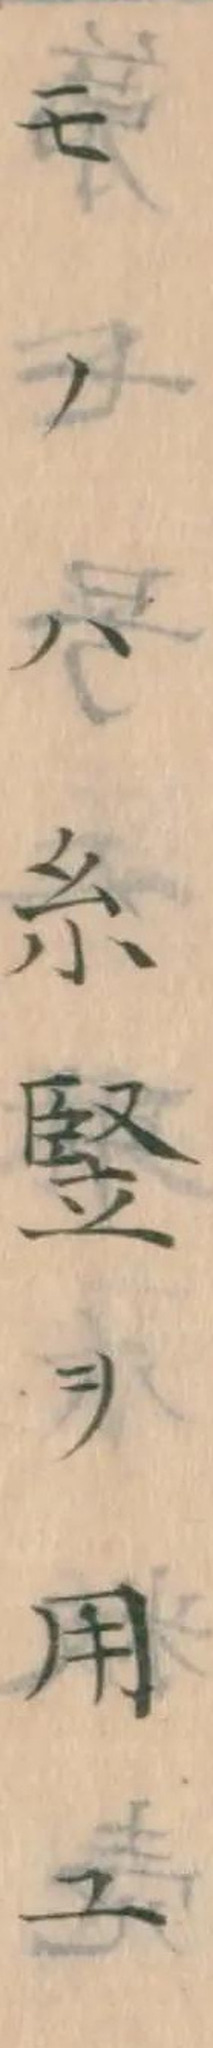モノハ糸竪ヲ用ユ
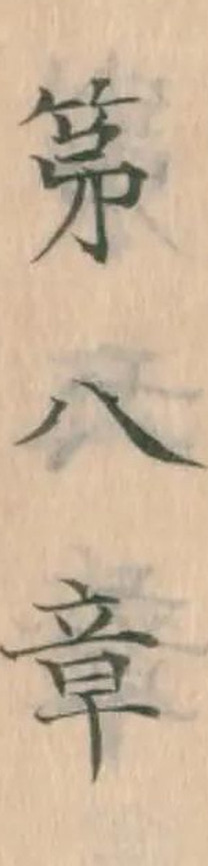第八章
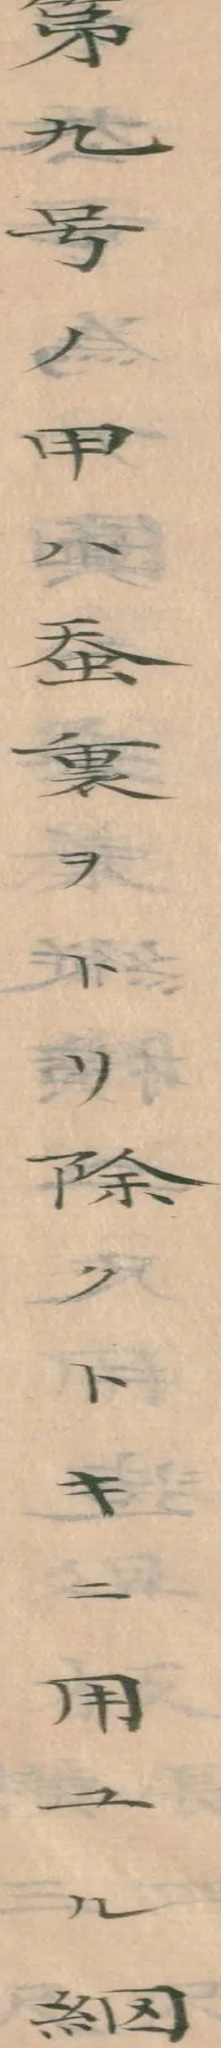第九号ノ甲ハ蚕裏ヲトリ除クトキニ用ユル網
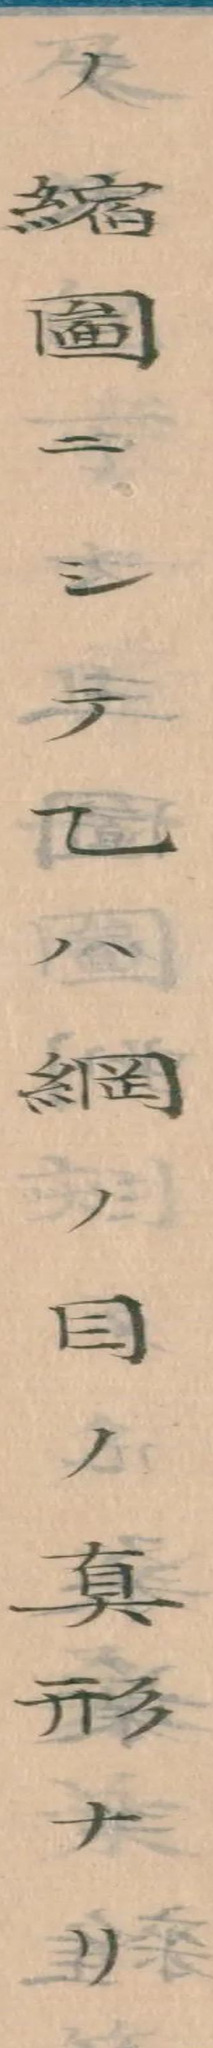ノ縮図ニシテ乙ハ網ノ目ノ真形ナリ
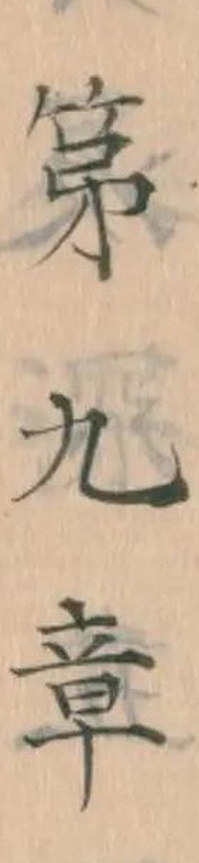第九章
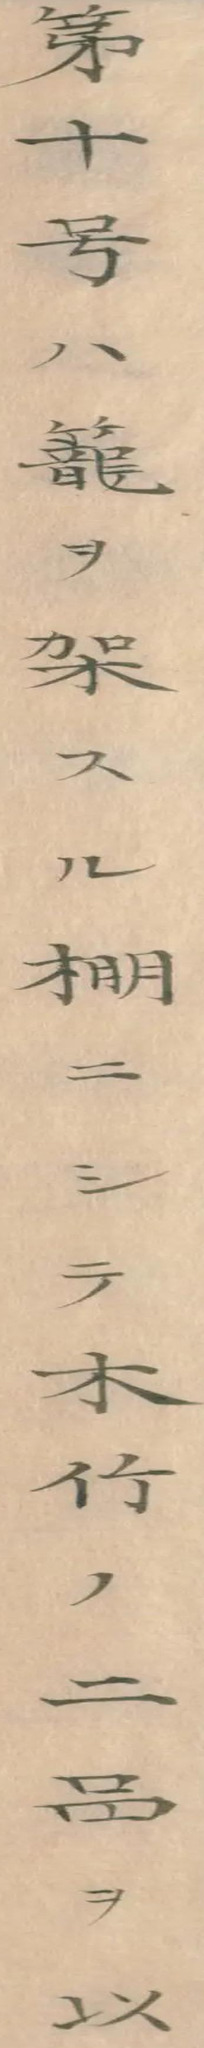第十号ハ籠ヲ架スル棚ニシテ木竹ノ二品ヲ以
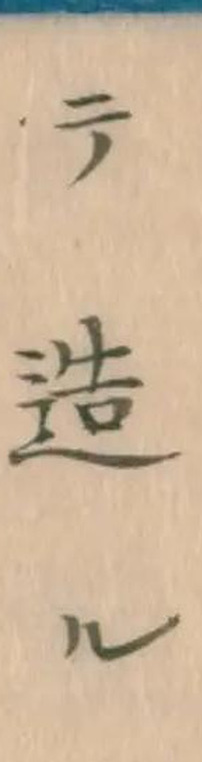テ造ル
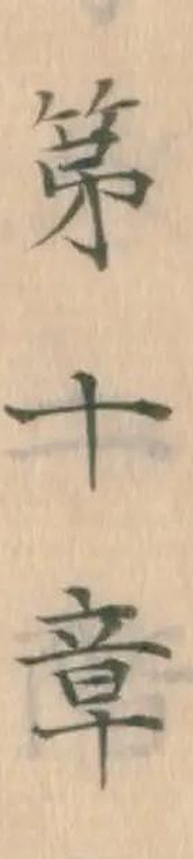第十章
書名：蚕桑集成
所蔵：国立国会図書館 National Diet Library, JAPAN
